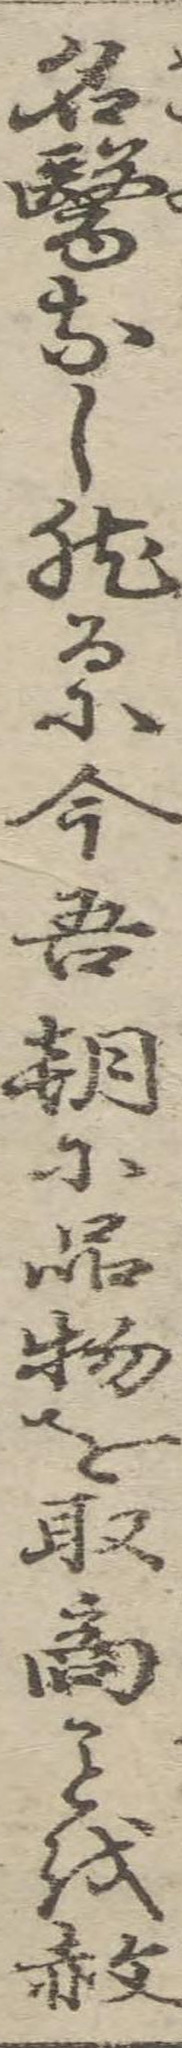名医なし然るに今吾朝に品物を取商ことを赦
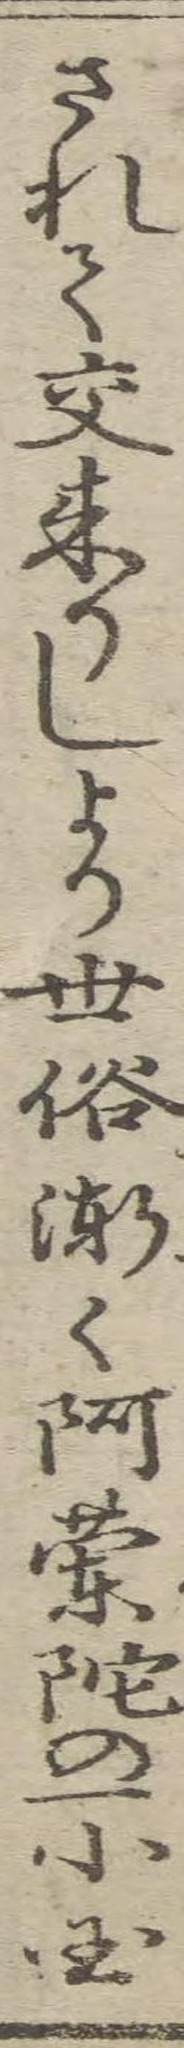されて交来りしより世俗漸く阿蘭陀の一小国
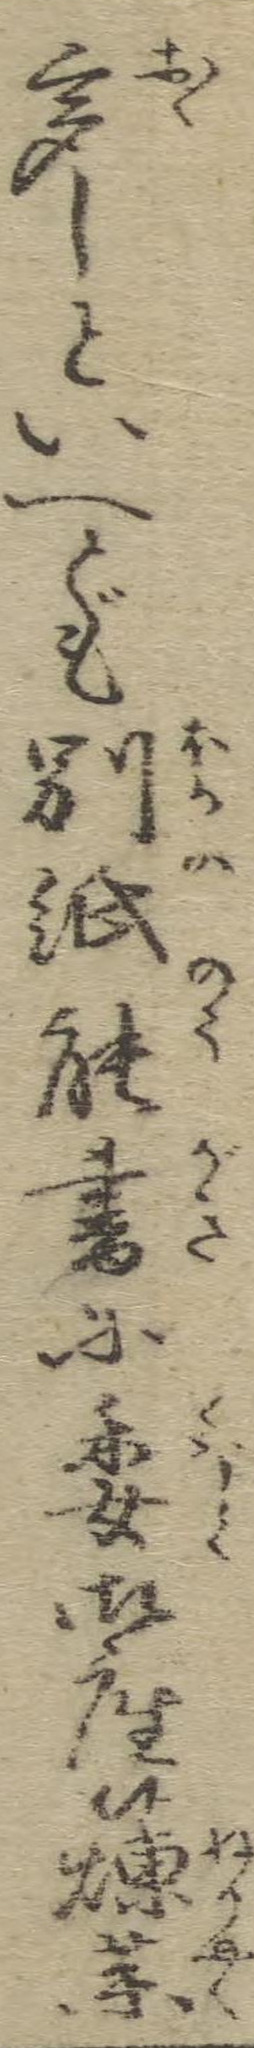多しといへども別紙能書に委御座候練薬
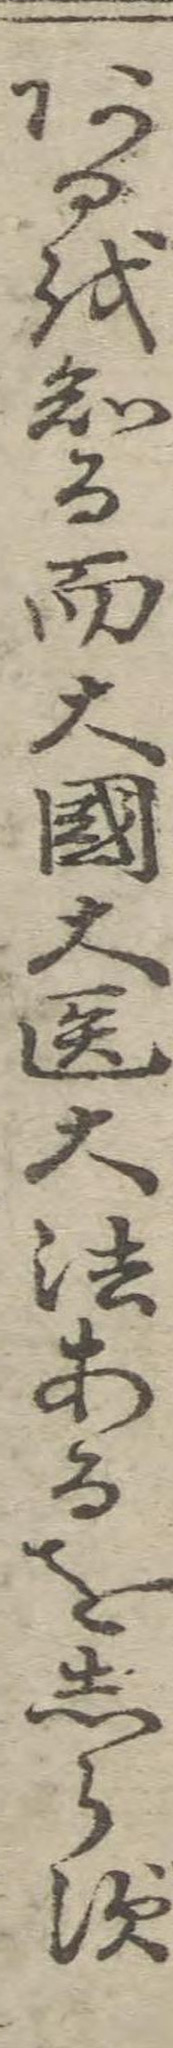あるを知る而大国大医大法あるをしらず
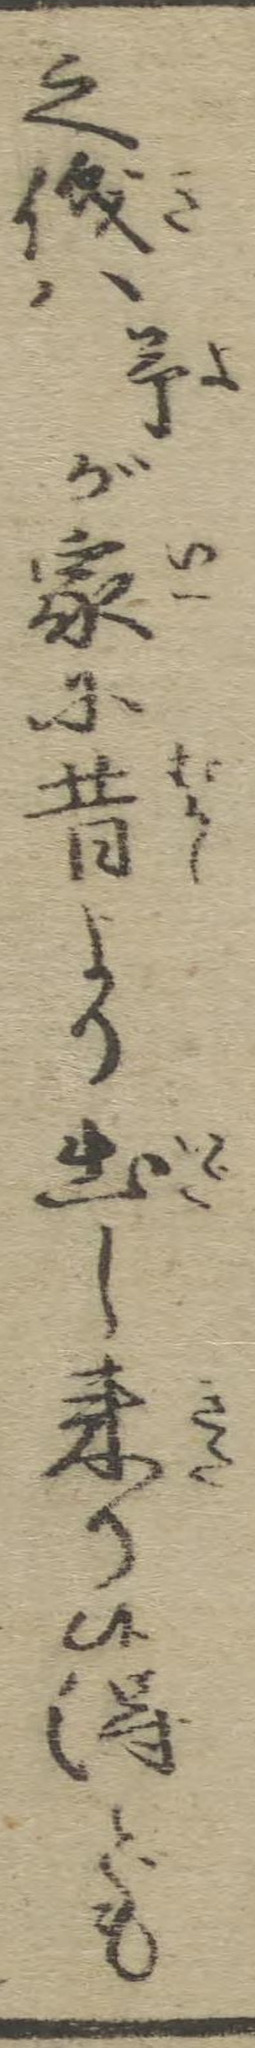之儀は予が家に昔より出し来り候得ども
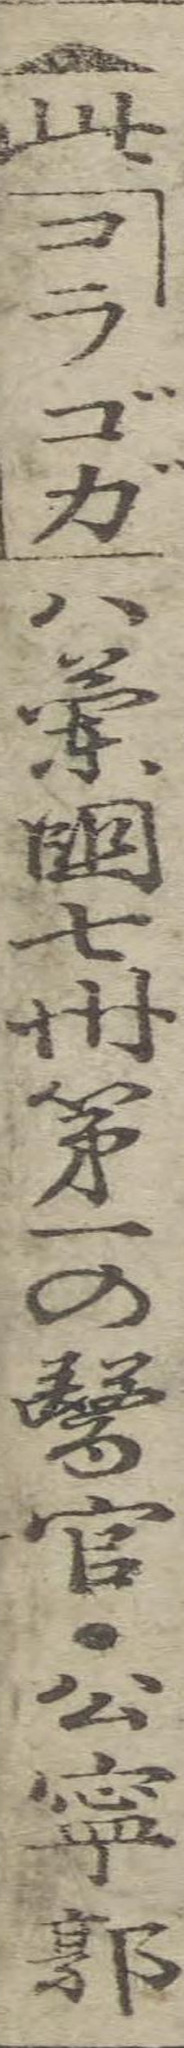▲此「コラゴガ」は蘭国七州第一の医官・公寧郭

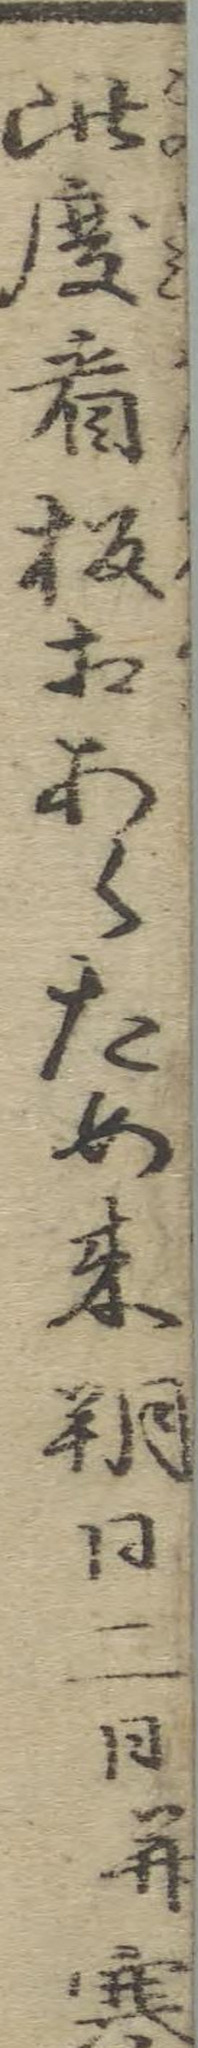此度看板相あらため来朔日二日并寒
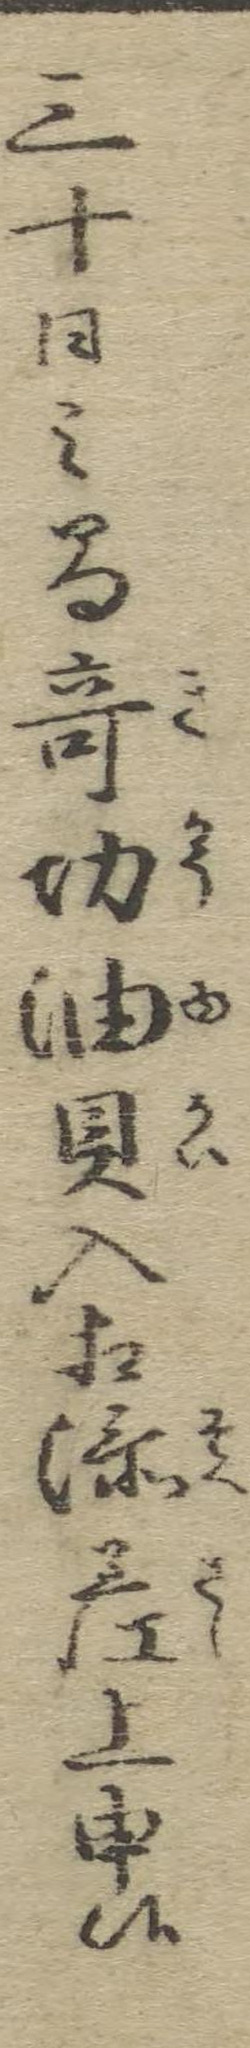三十日之間奇功油貝入相添差上申候
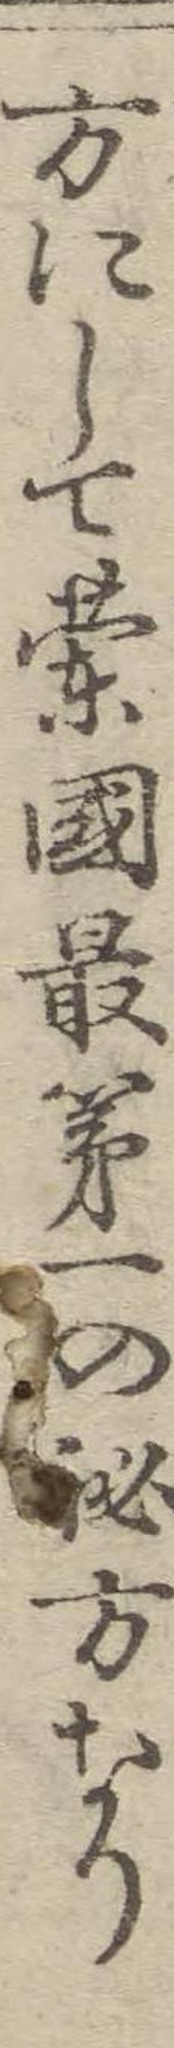方にして蘭国最第一の秘方なり
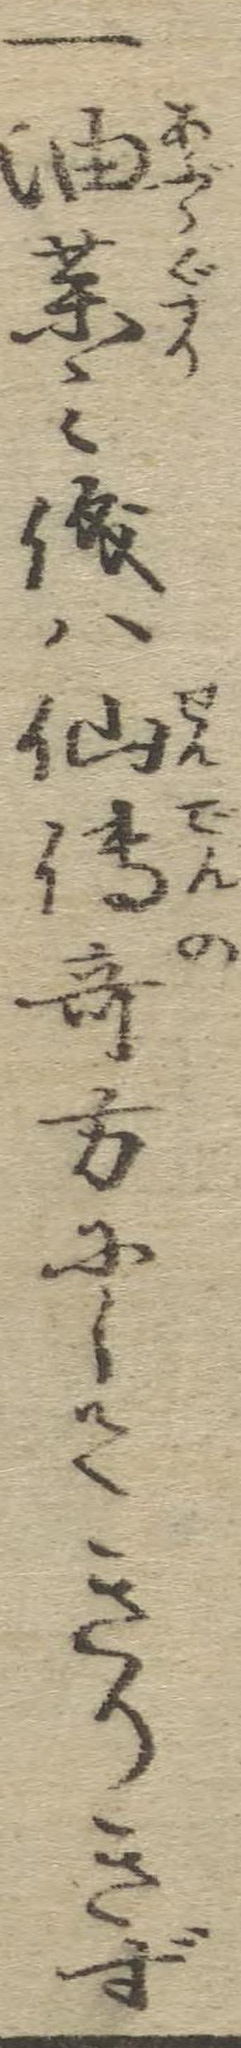一油薬之儀は仙傳奇方にしてきりきず
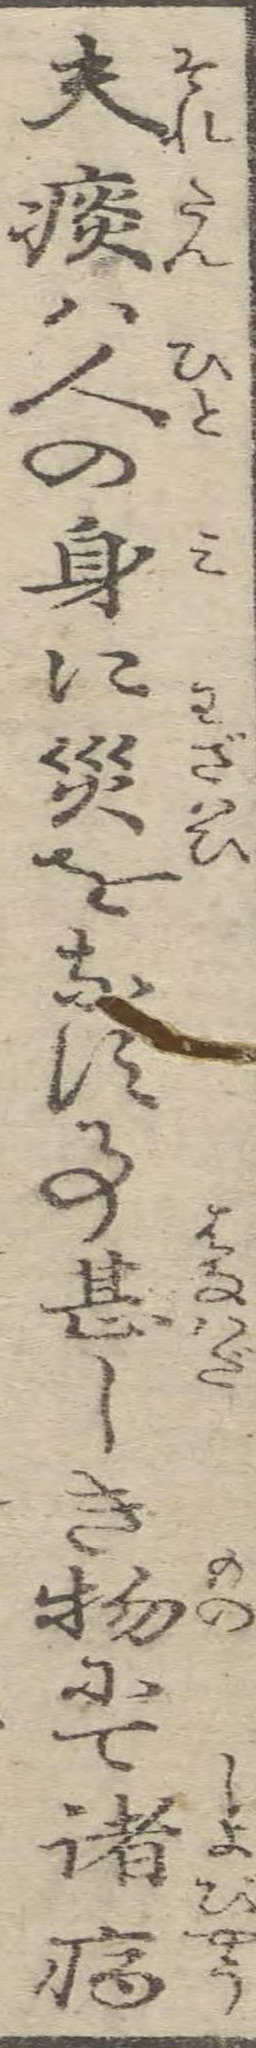夫痰は人の身に災をなす事甚しき物にて諸病
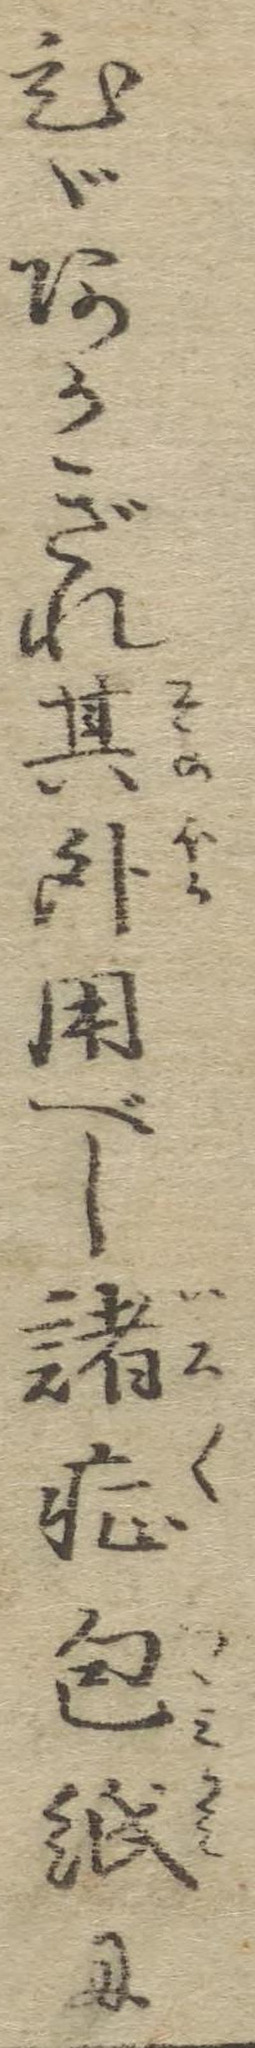ひゞあかぎれ其外用べし諸症包紙に
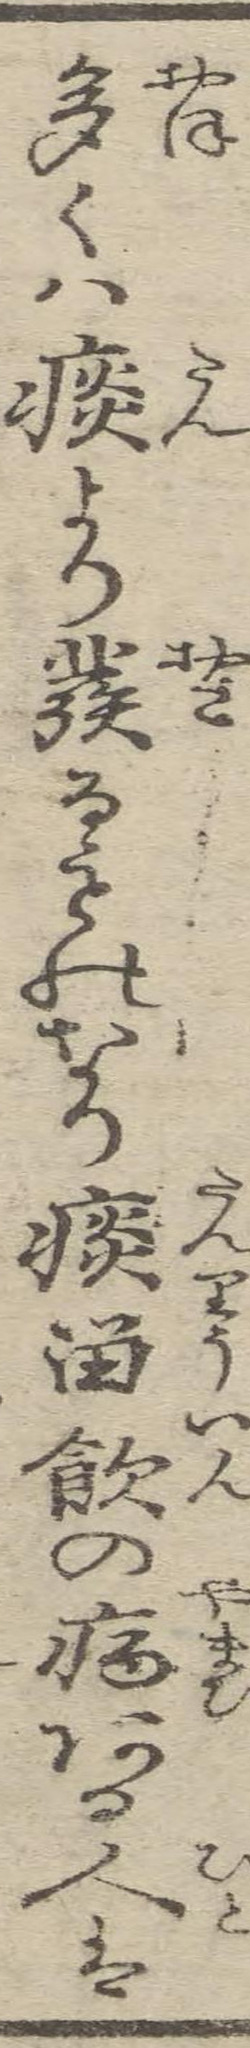多くは痰より発るものなりた痰留飲の病なる人は
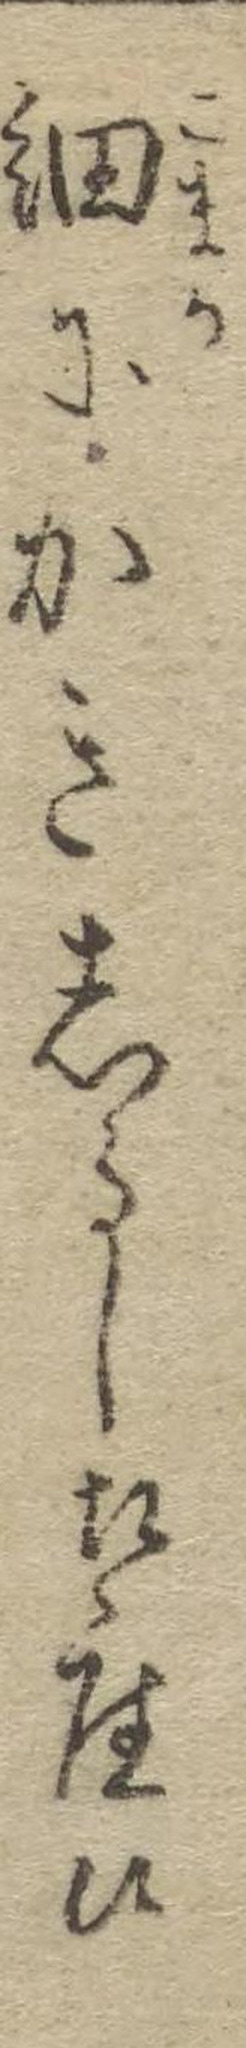細にかきしるし御座候
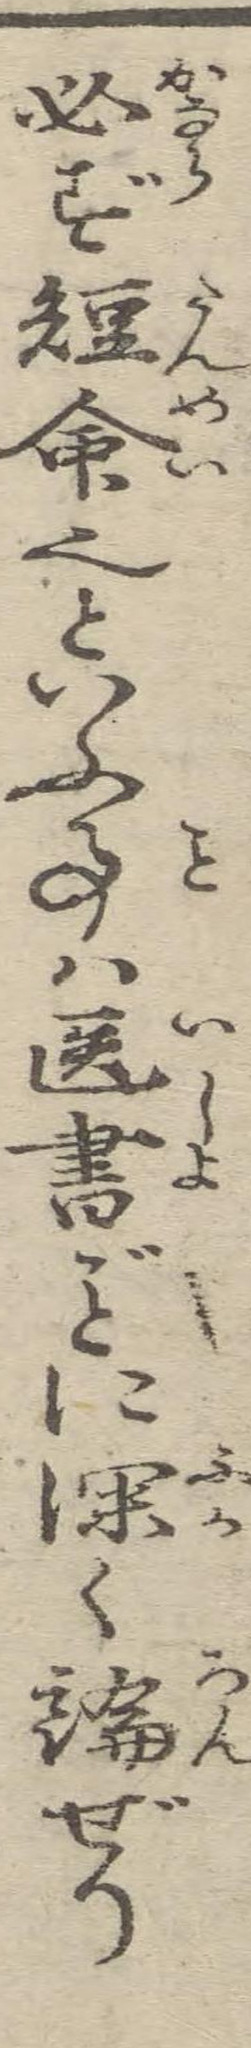必ず短命也といふ事は医書ごとに深く論ぜり
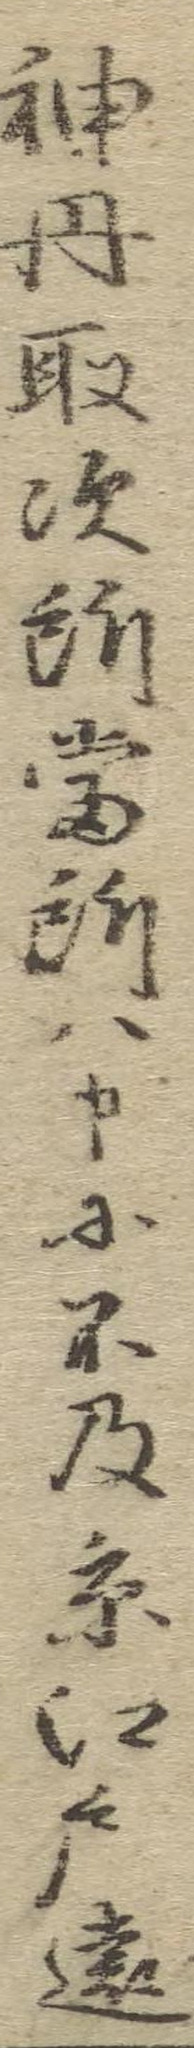神丹取次所当所は申に不及京江戸遠
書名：浪華薬種問屋能書張交帖. 二
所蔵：国立国会図書館 National Diet Library, JAPAN
